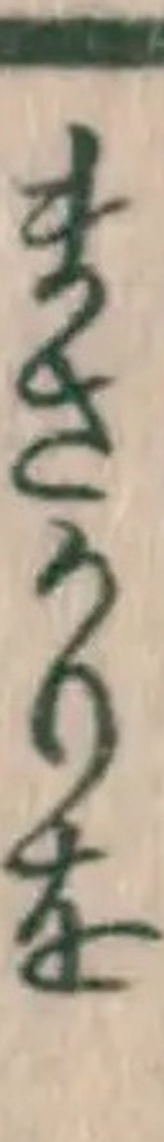まさかりを
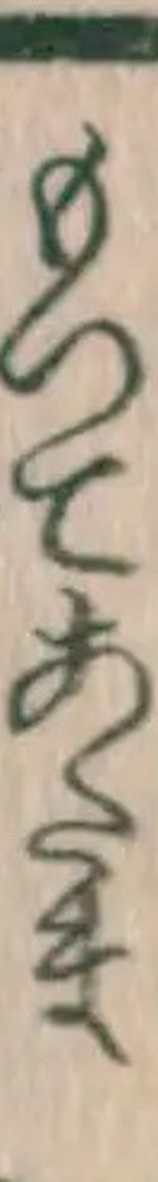もつてあたま
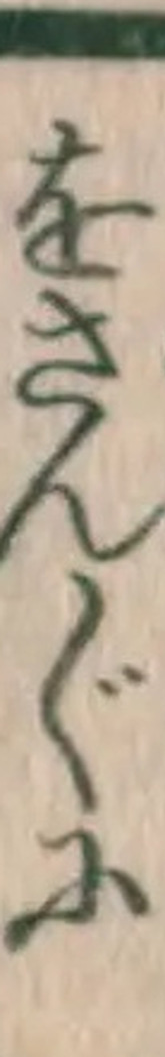をさん〴〵に
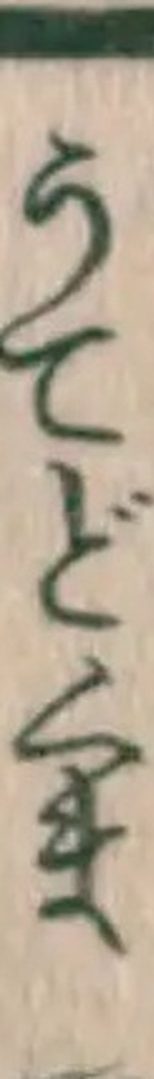うてどくま
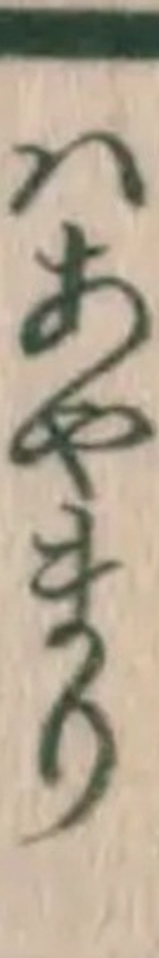はあやまり
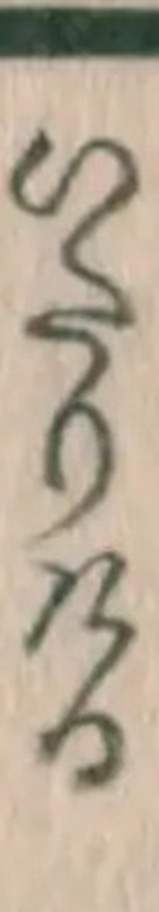いたりける
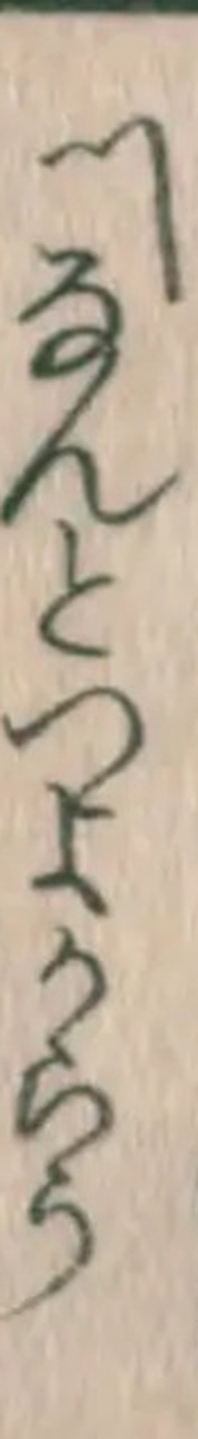〽なんとつよからう
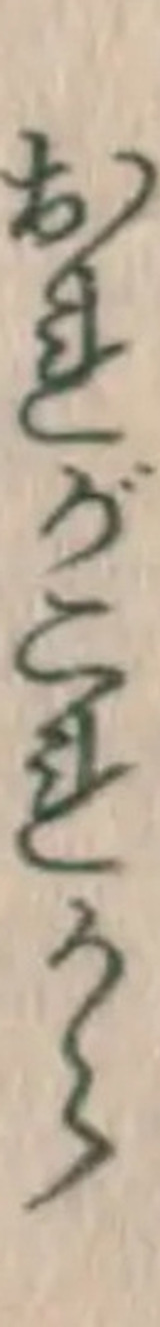おれがこれから
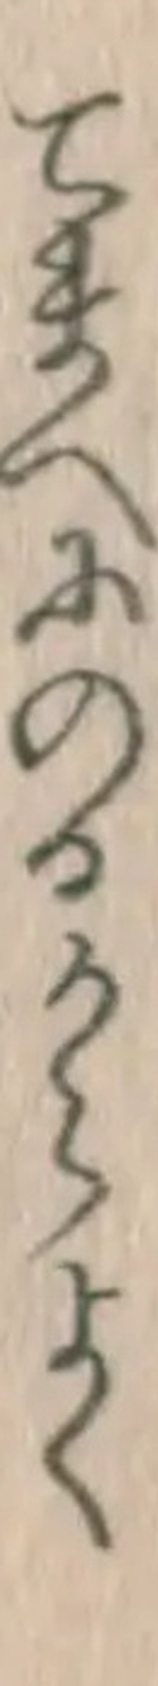てまへにのるからよく
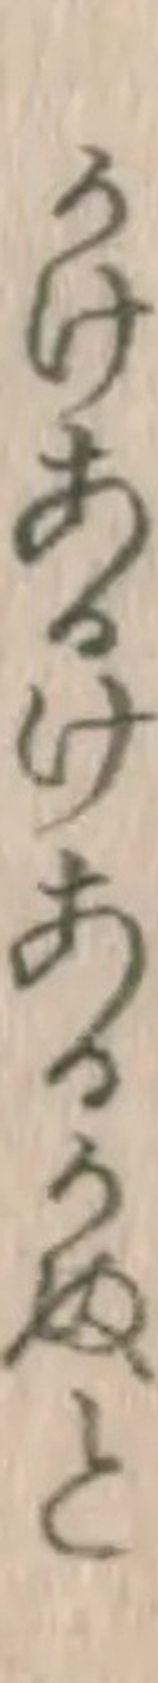かけあるけあるかぬと
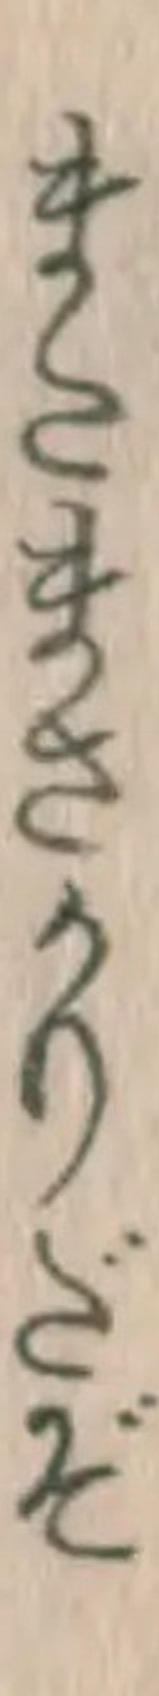またまさかりだぞ

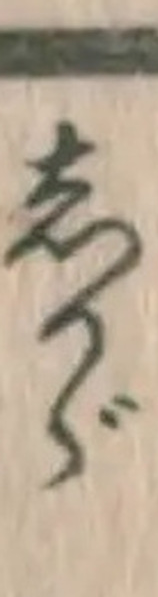しかゞ
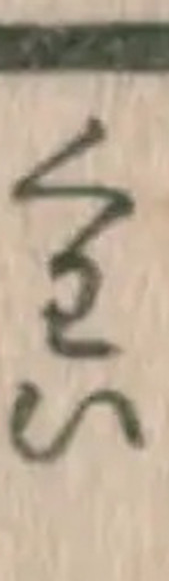くわい
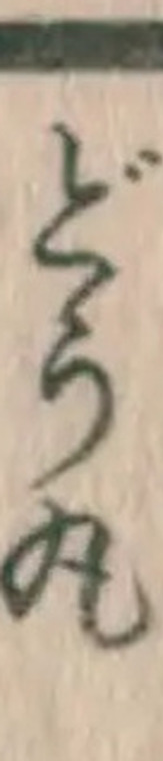どう丸
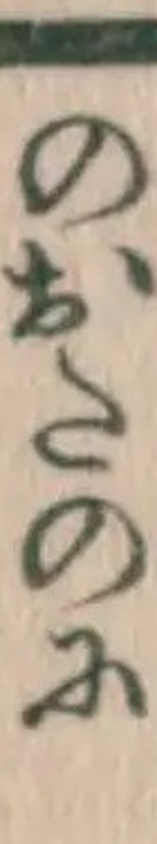のおたのに
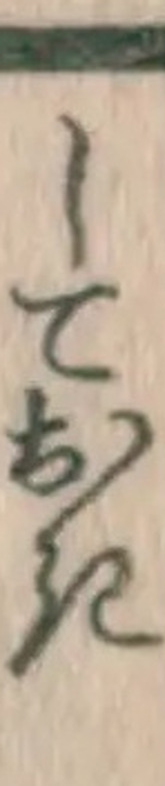しておき
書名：金太郎
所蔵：国立国会図書館 National Diet Library, JAPAN
